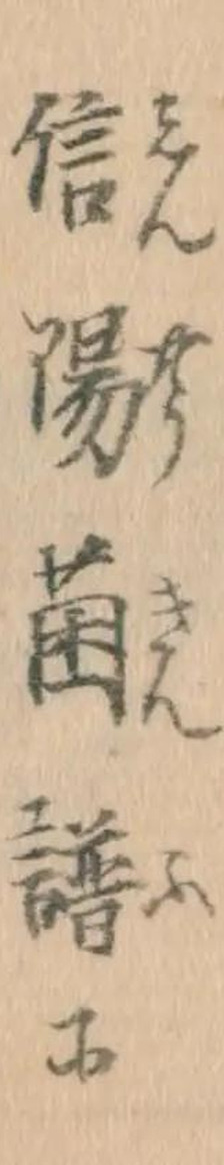信陽菌譜に

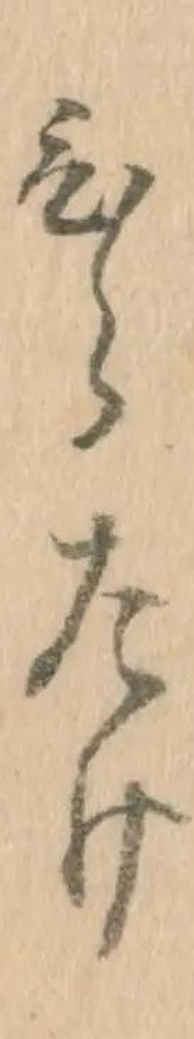ひらたけ
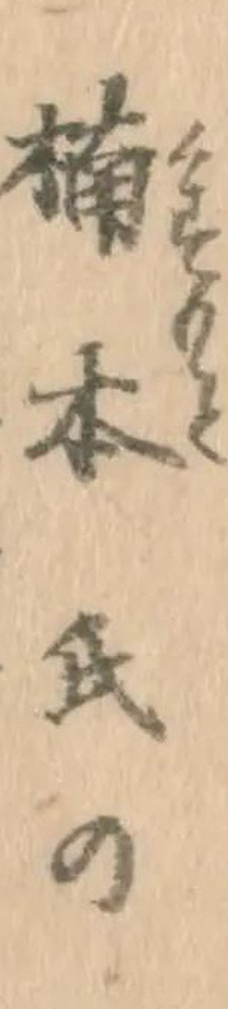楠本氏の
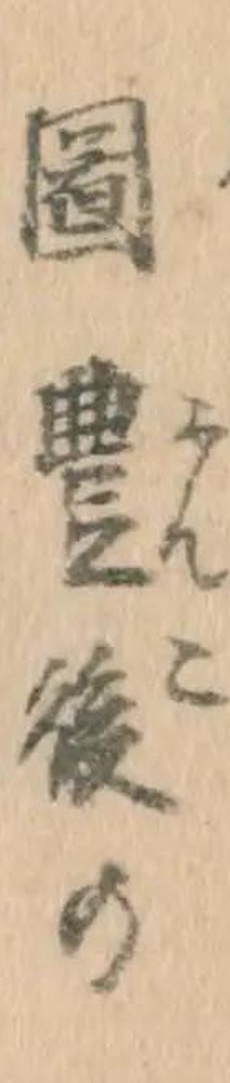図豊後の
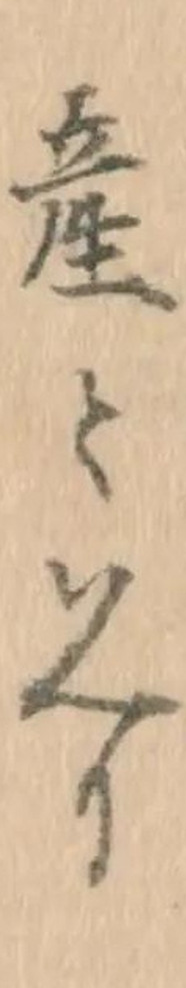産といへり

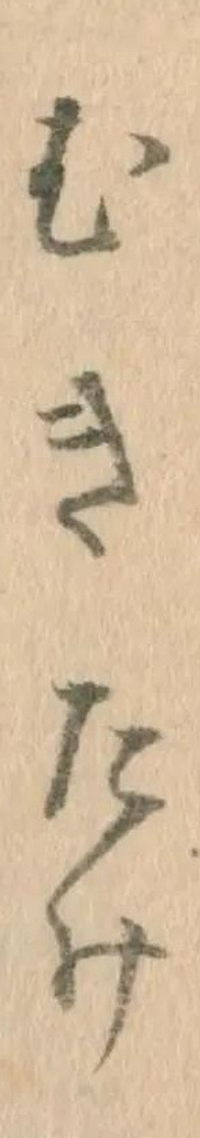むきたけ
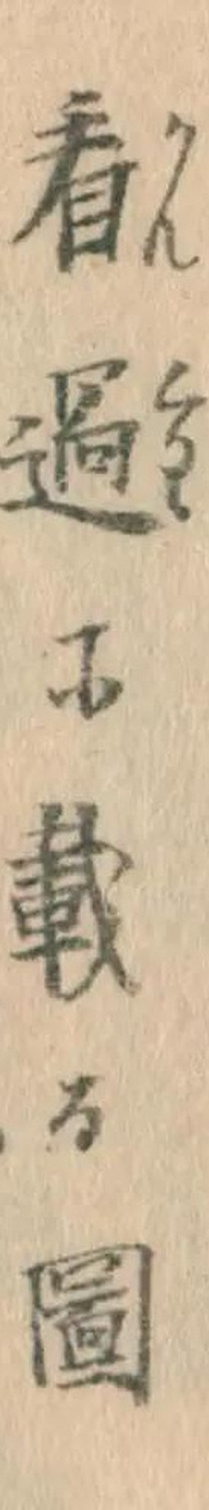看過に載る図
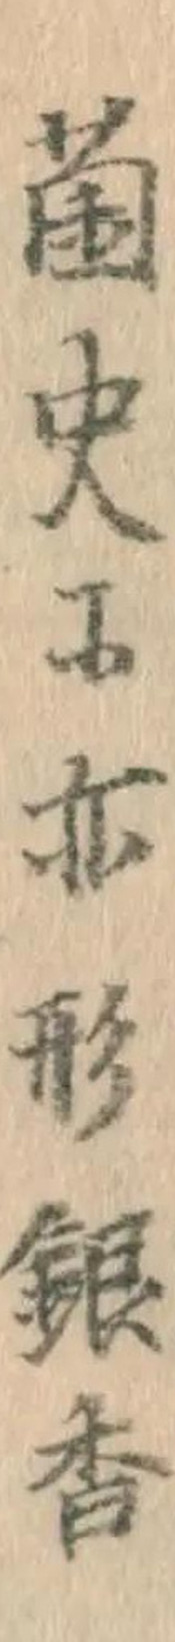菌史に亦形銀香
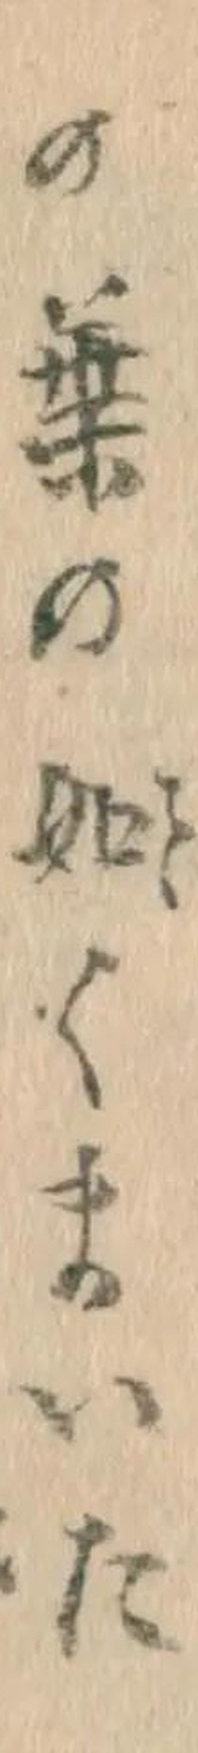の葉の如くまいた
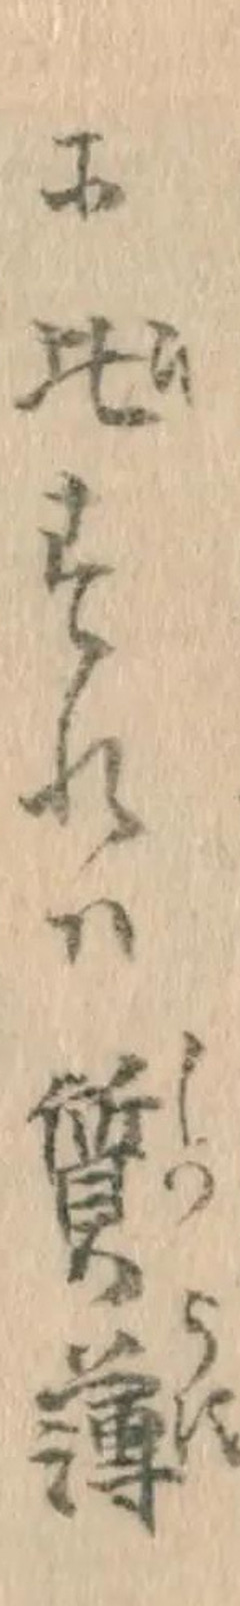に比すれは質薄
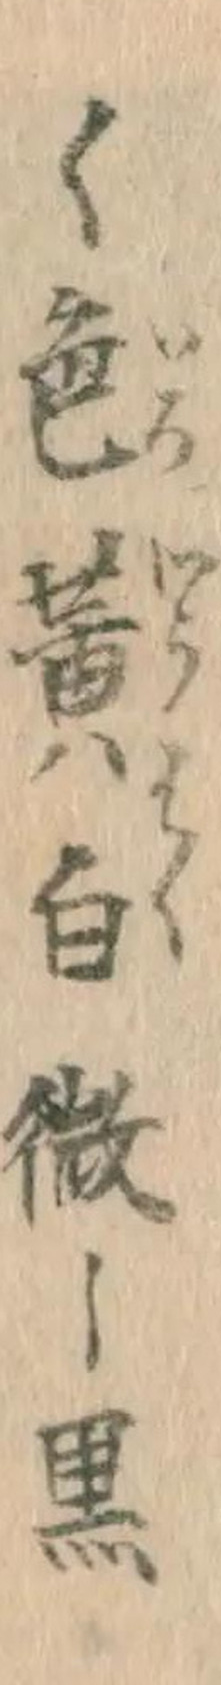く色黄白微し黒
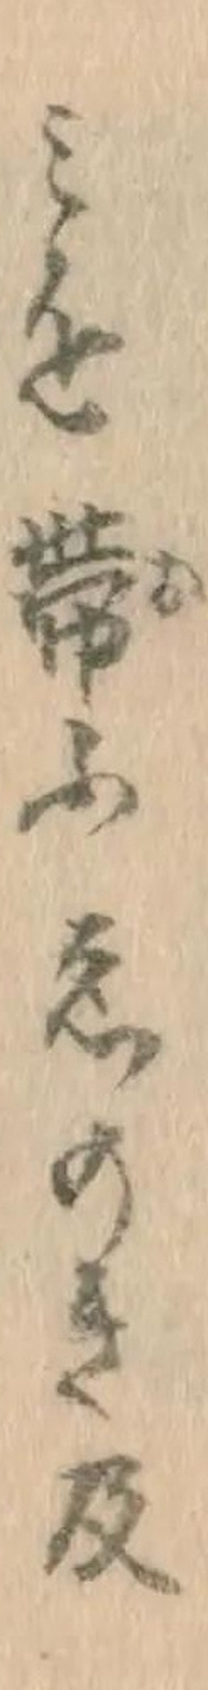みを帯ふゑのき及
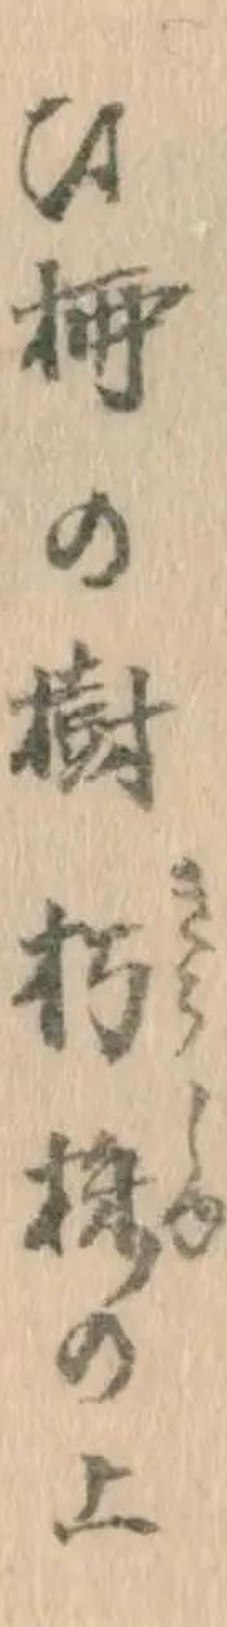ひ柳の樹朽株の上
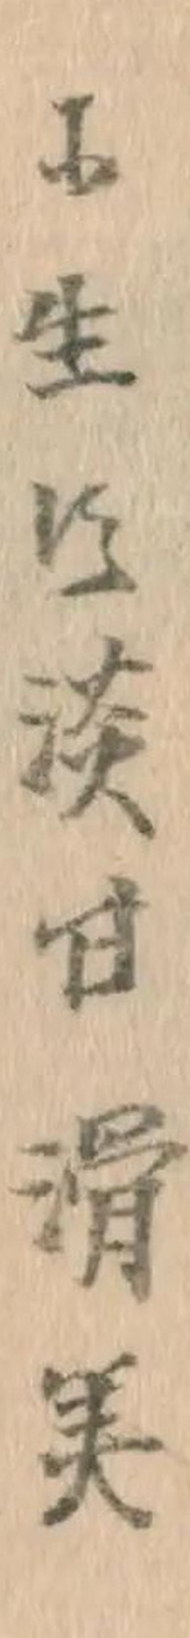に生す淡甘滑美
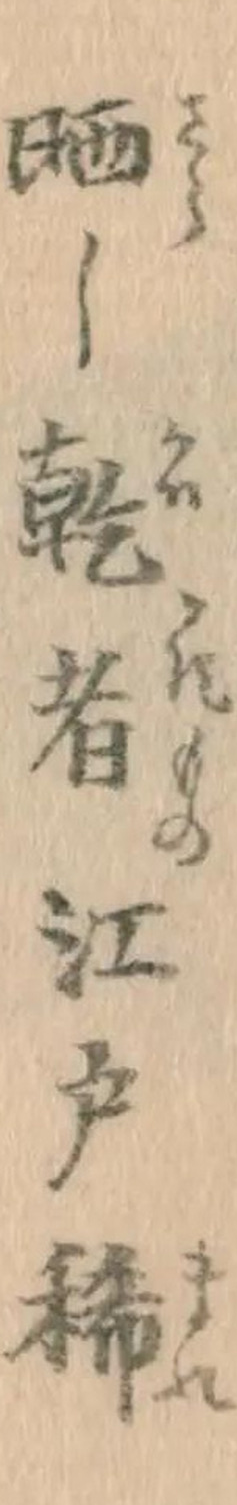晒し乾者江戸稀
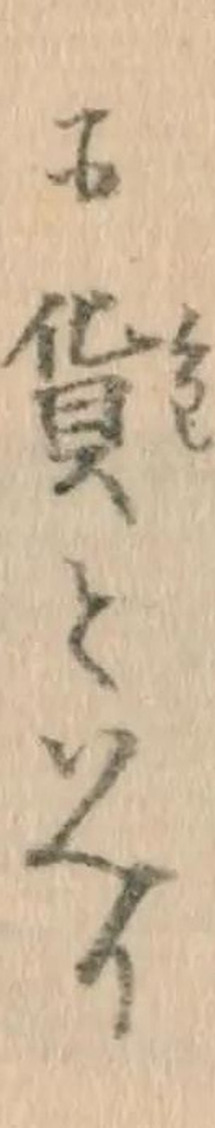に貨といへり
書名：本草図譜. 巻58-60
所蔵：国立国会図書館 National Diet Library, JAPAN
